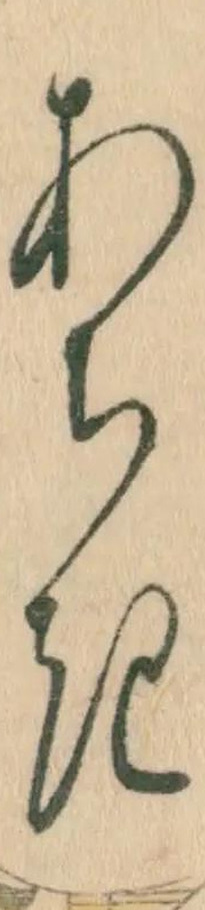あちき
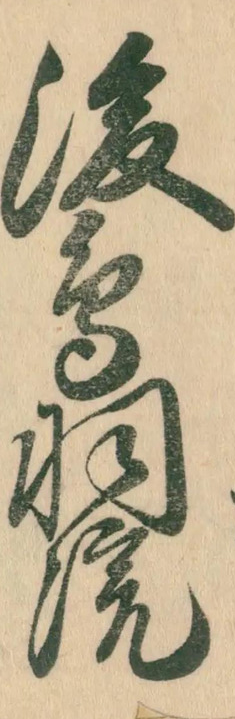後鳥羽院
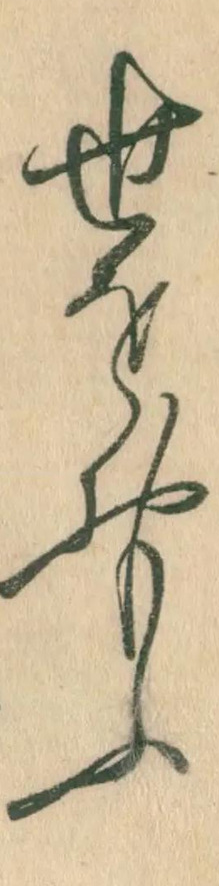世をおもふ
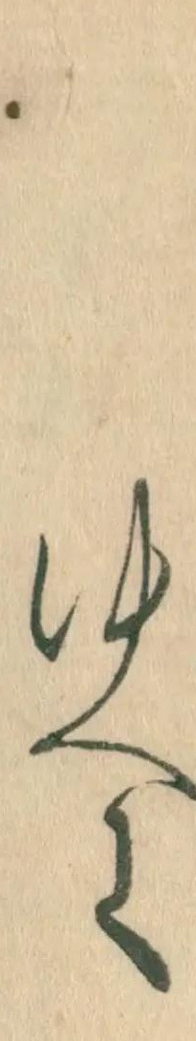ゆへに
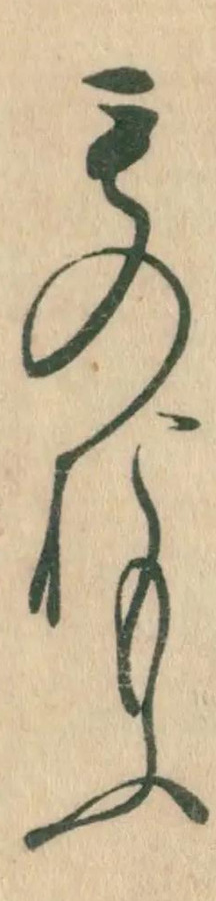ものおもふ

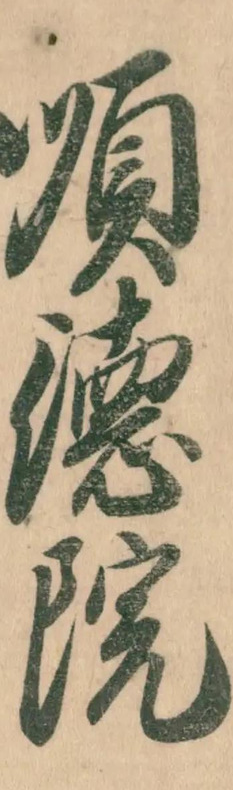順徳院
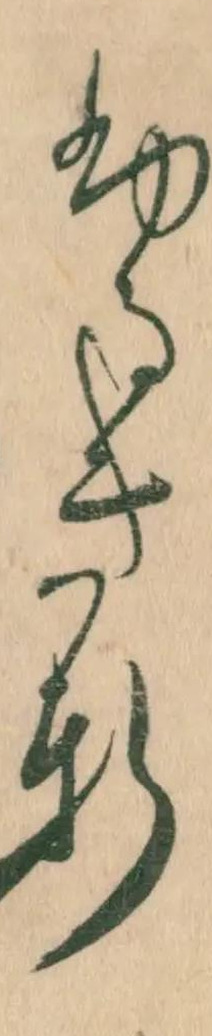ふるき軒
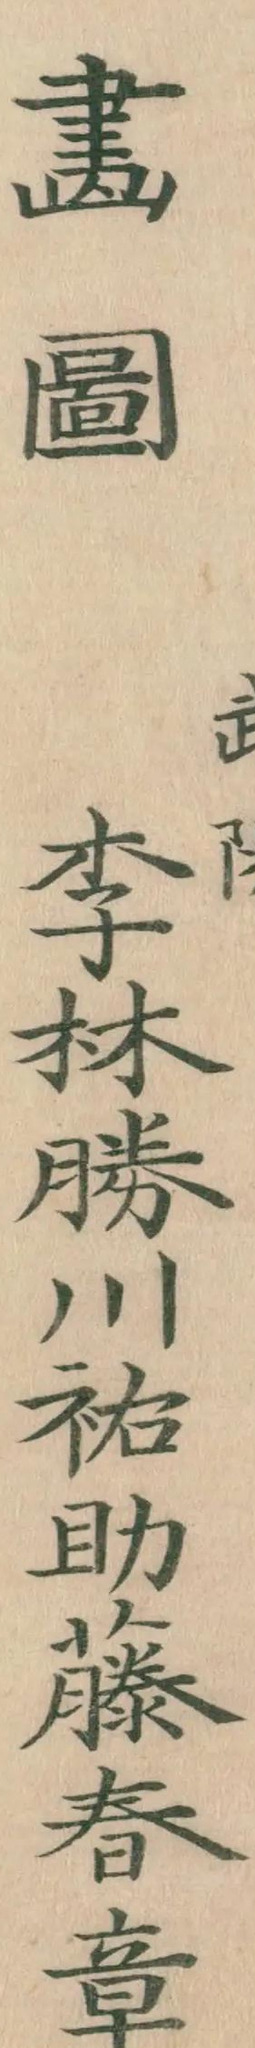書図李林勝川祐助藤春章
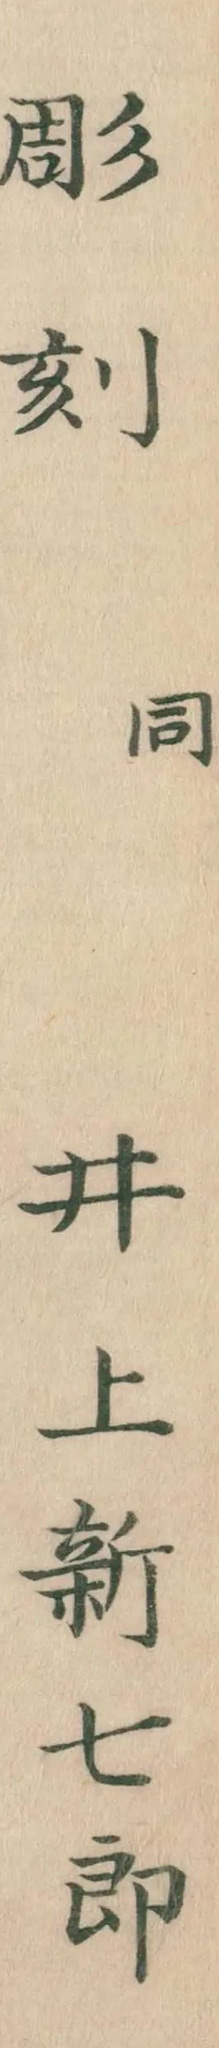彫刻井上新七郎
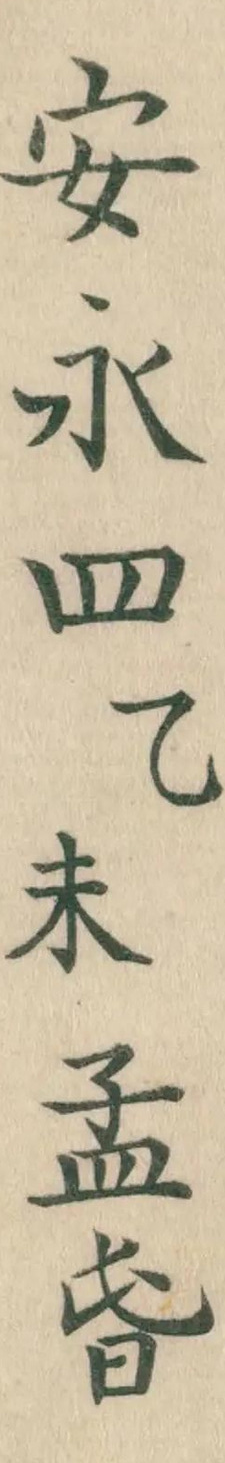安永四乙未孟春
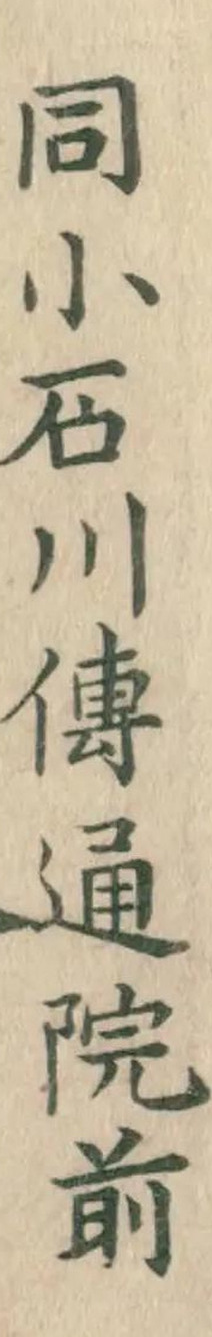同小石川伝通院前
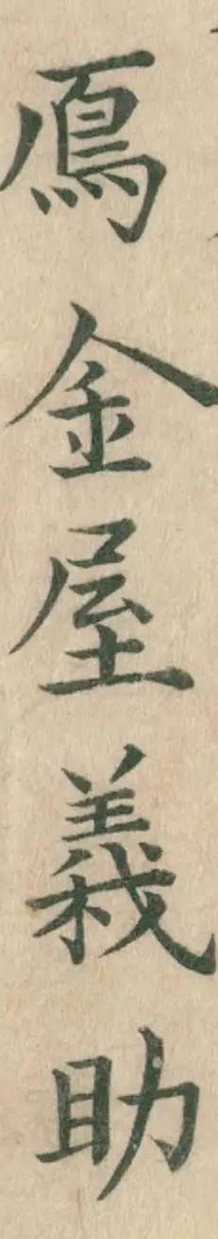雁金屋義助
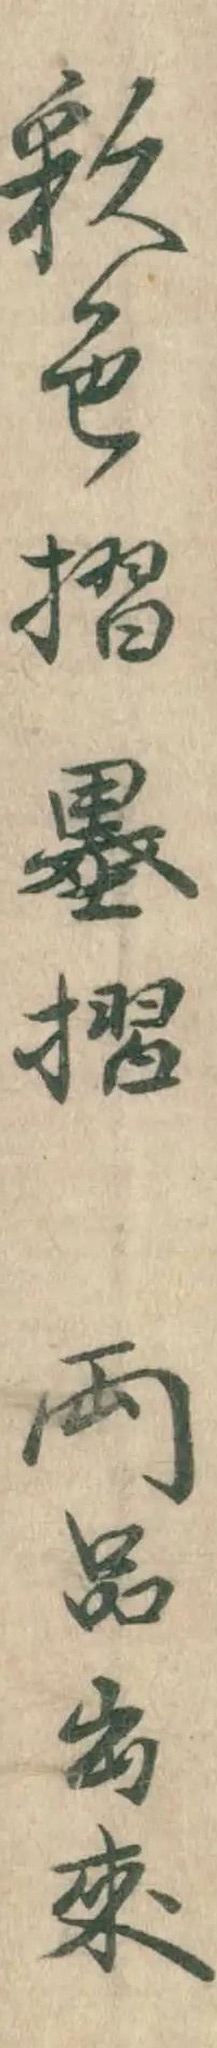彩色摺墨摺両品出来
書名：錦百人一首あつま織
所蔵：国立国会図書館 National Diet Library, JAPAN
